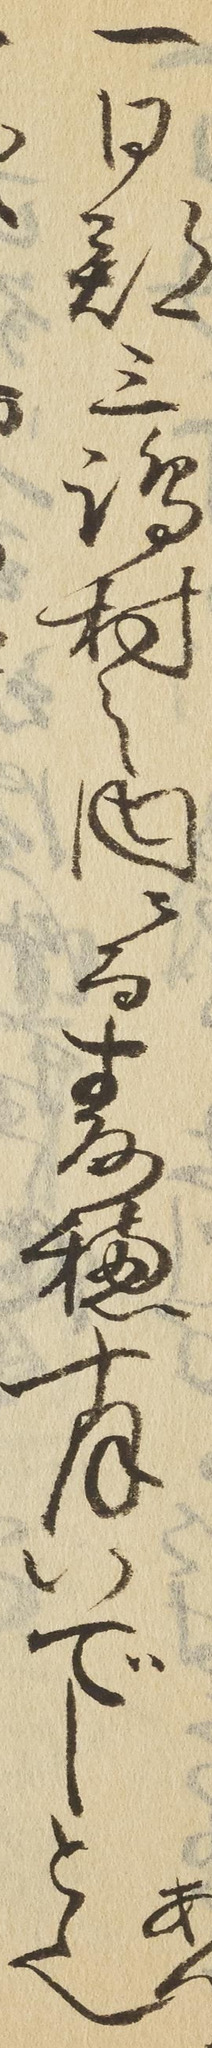一同郡三嶋村之内二而麦穂十月いでしと也
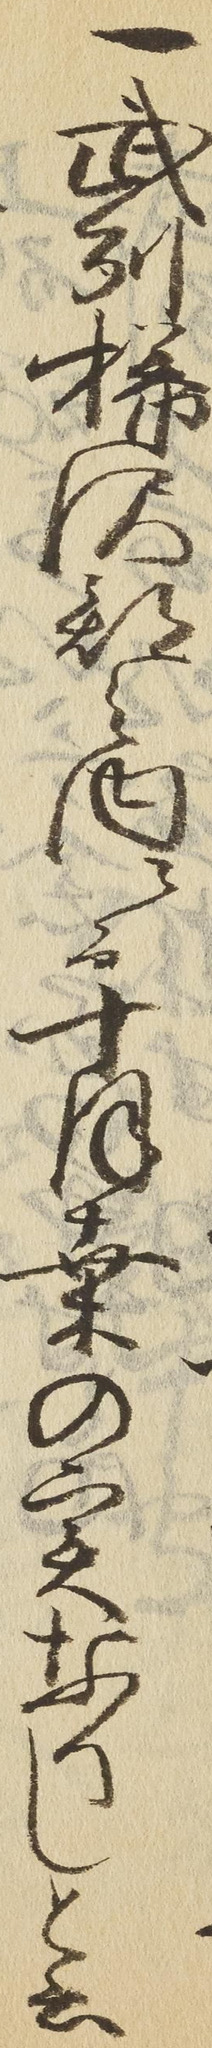一武州榛沢郡の内ニ而十月桑の実なりしと云
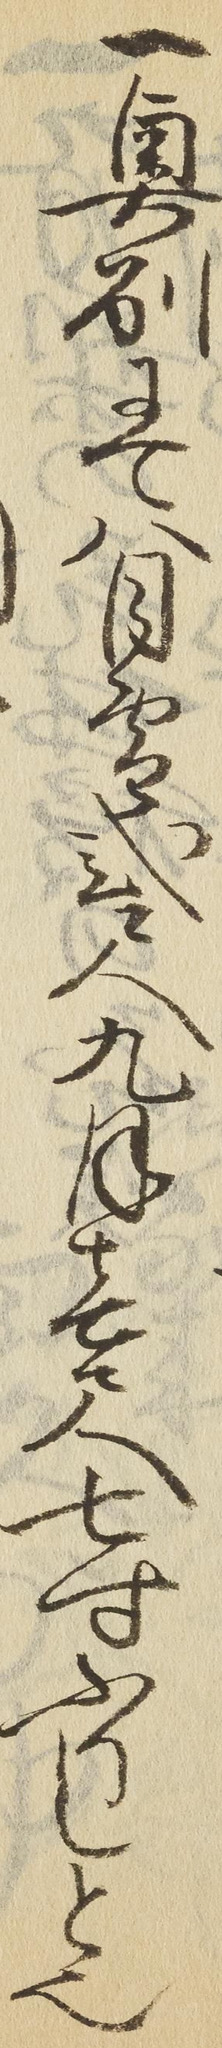一奥州ニて八月雪弐尺余九月壱尺七寸ふりしと也
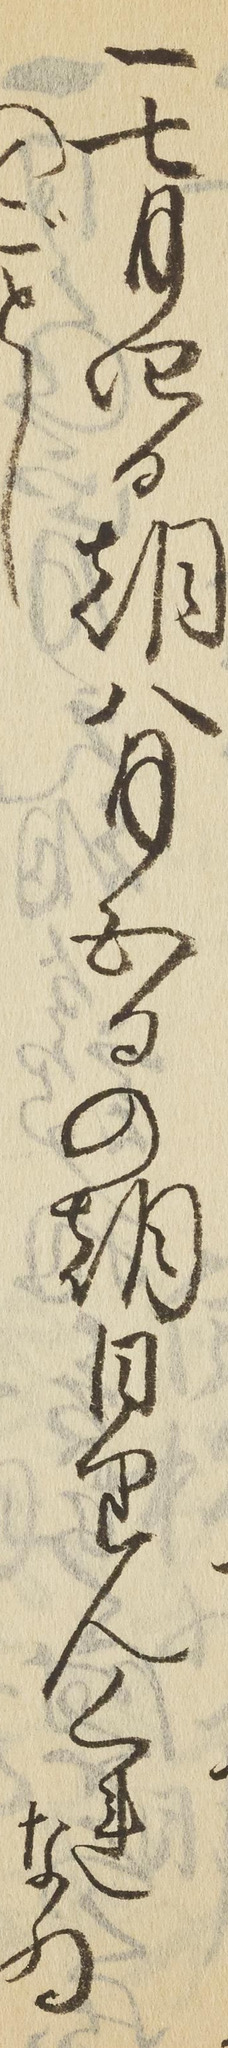一七月四日朝八月五日の朝日りんくれない
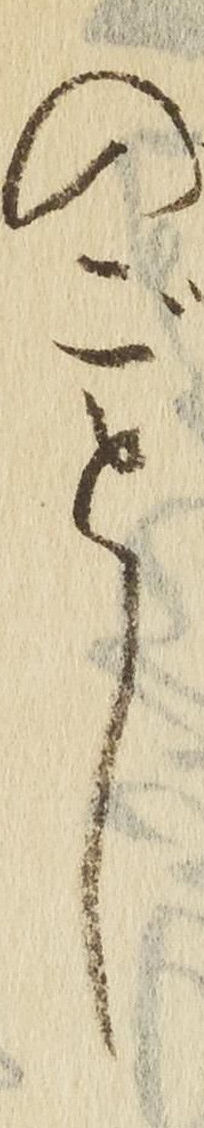のことし
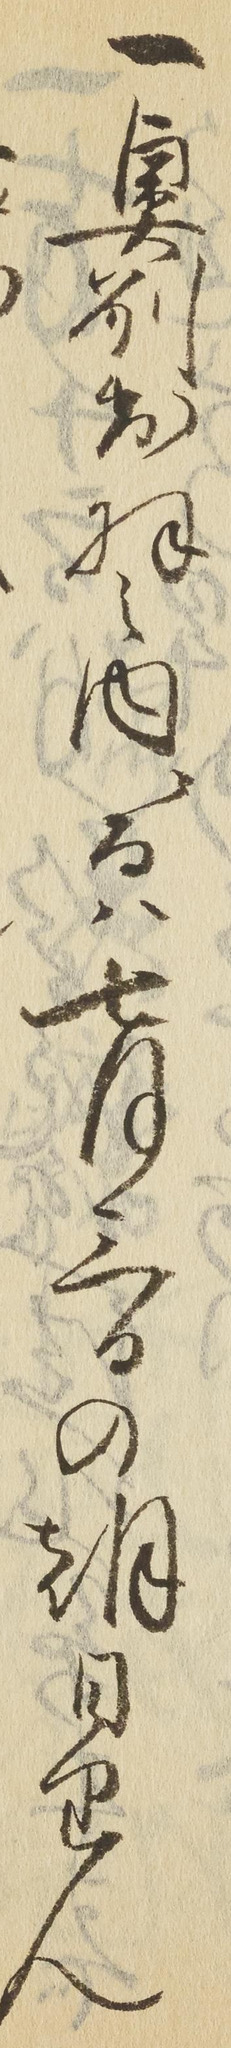一奥州出羽之内二而七月三日の朝日りん
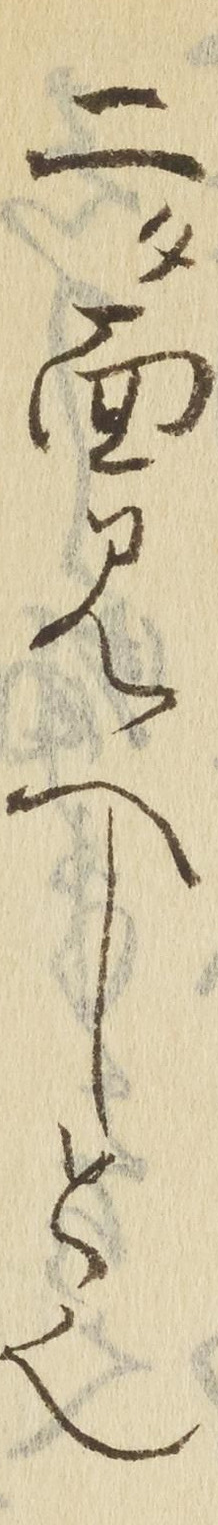二タ面見へしと也
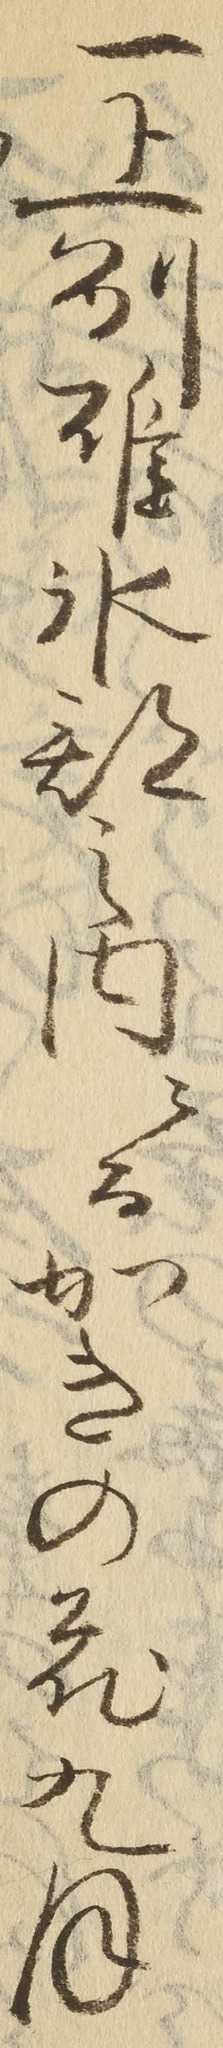一上州碓井郡之内二而かきの花九月
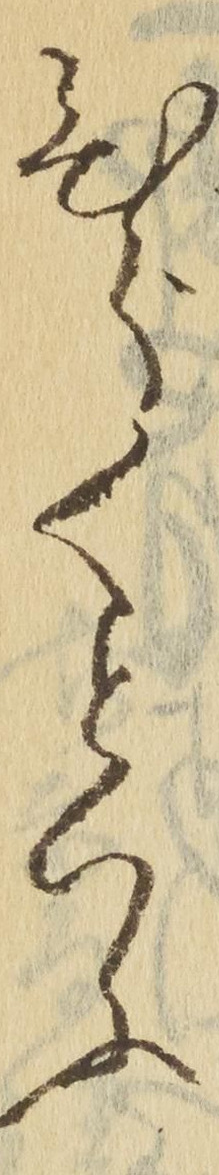ひらくと也いふ
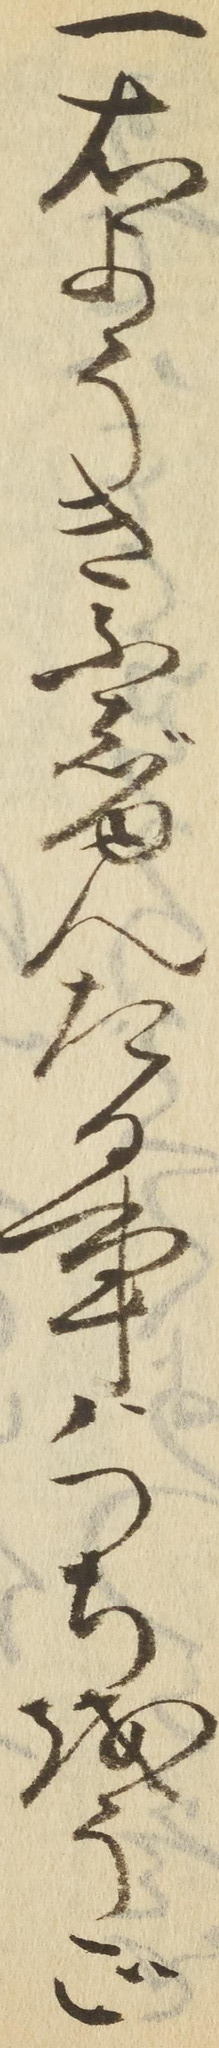一右ようきふしゆんなる事ハつちをうご
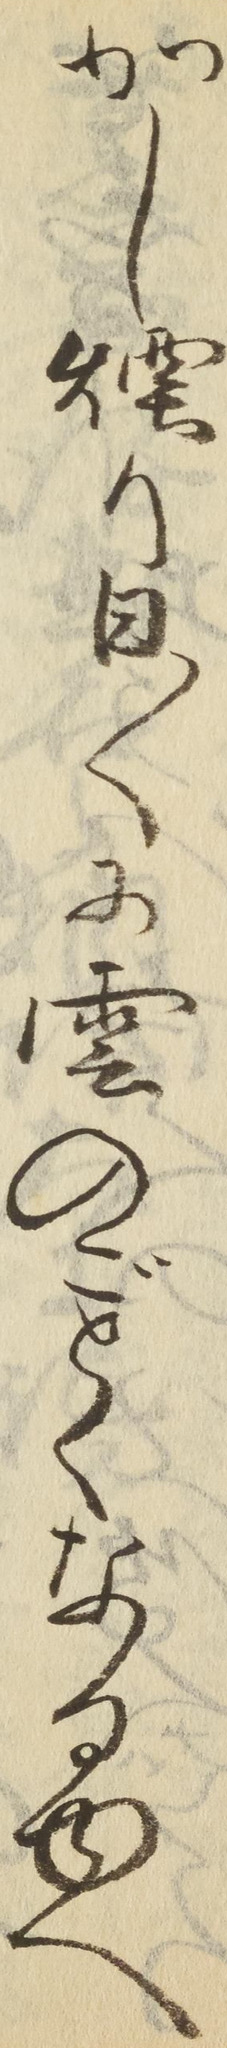かし煙り日々に雲のことくなるゆへ
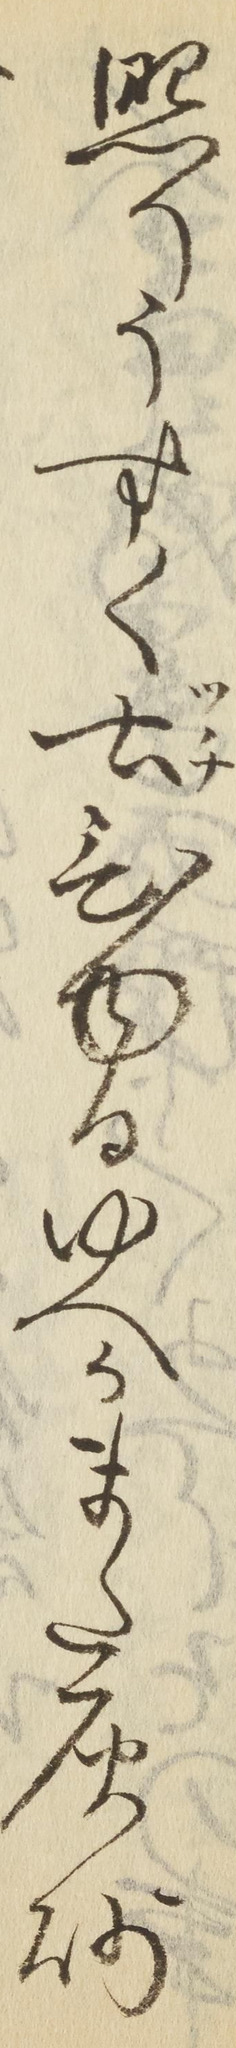照りうすく土ひるるゆへかまた灰砂
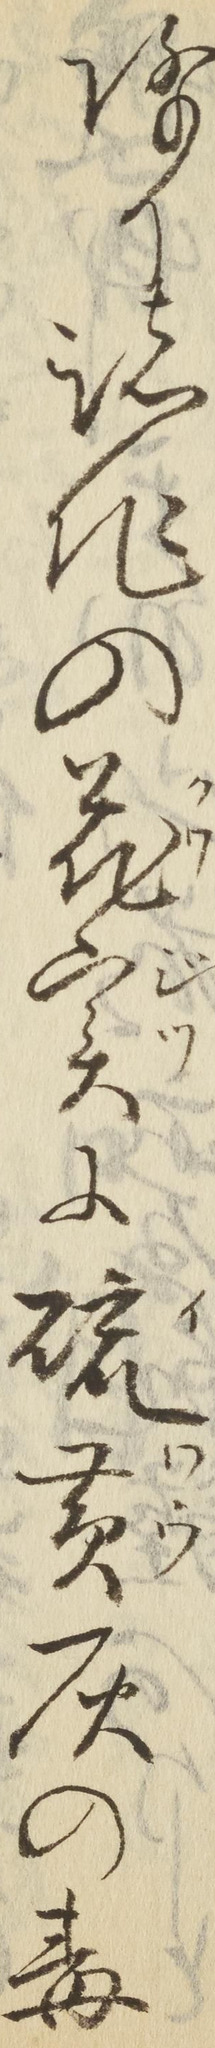降り諸作の花実に硫黄灰の毒
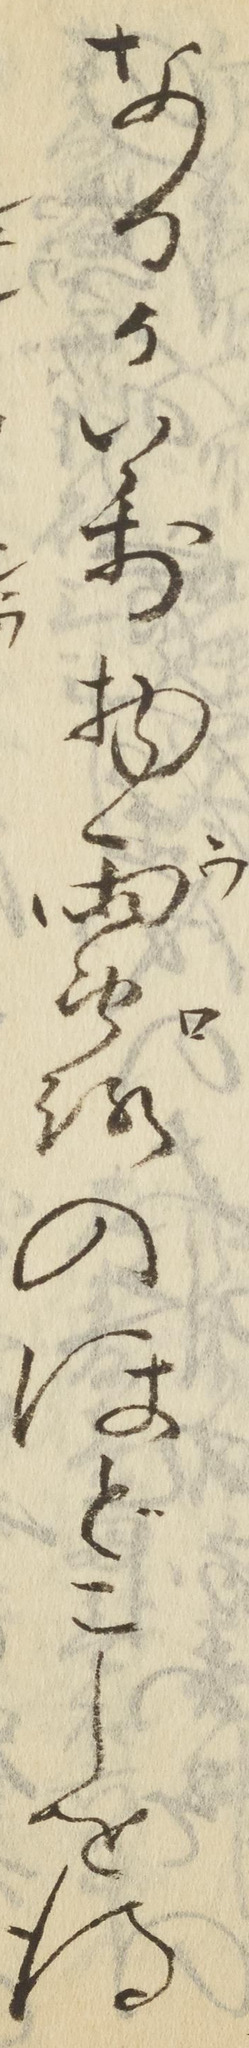なるか万物雨露のほどこしを得
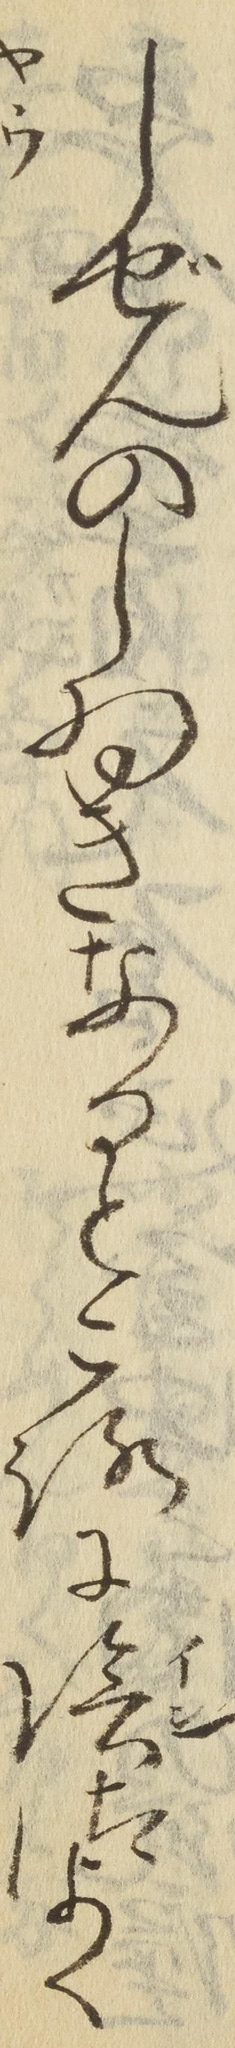しぜんのしゐきなるところに陰つよく
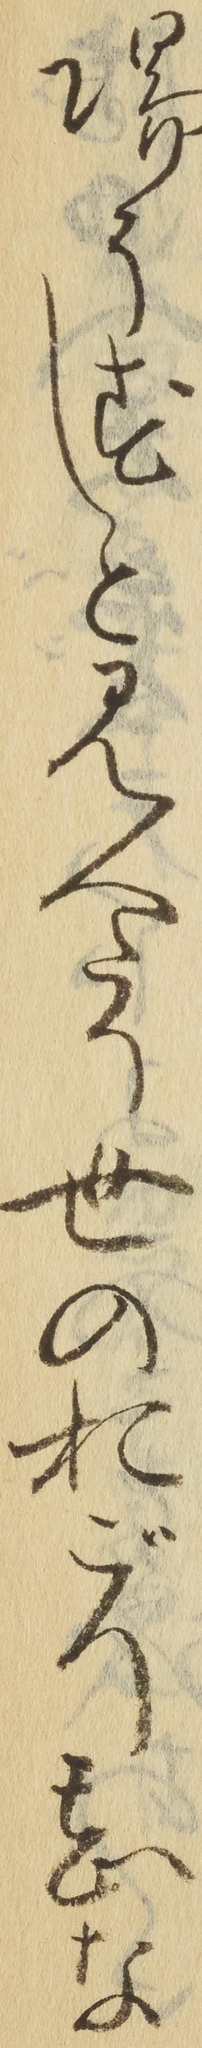陽うすしと見へたり世のおごり甚な
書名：浅間大變記
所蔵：東京大学地震研究所図書室 Earthquake Research Institute Library, The University of Tokyo, JAPAN
